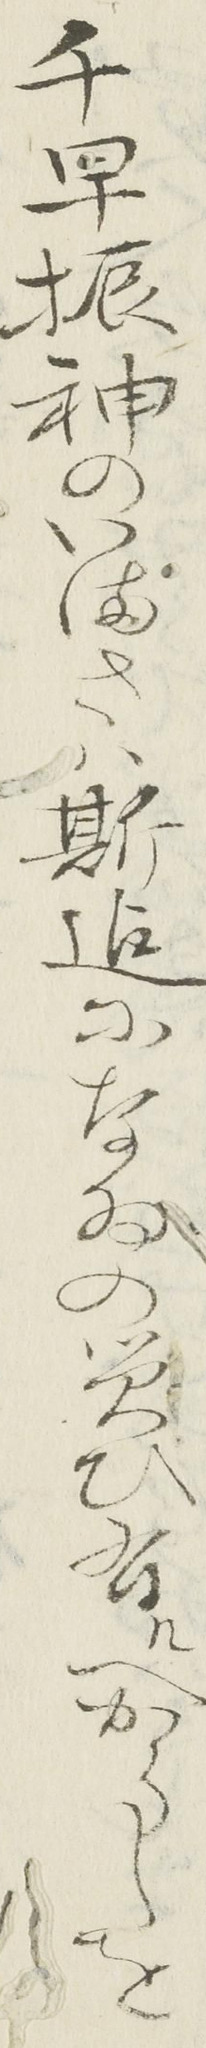千早振神のいまさハ斯迄になゐの災ひ有ルへからしを
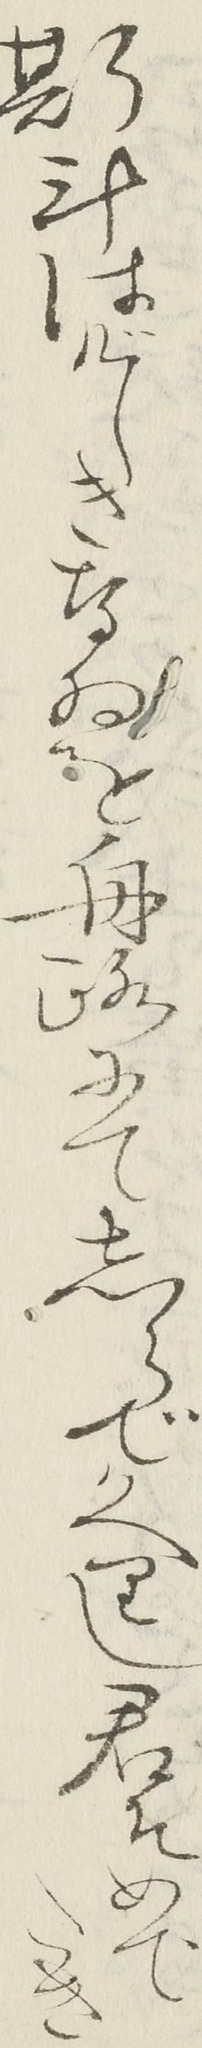斯斗はげしきなゐを舟路にてしらでかへりしを
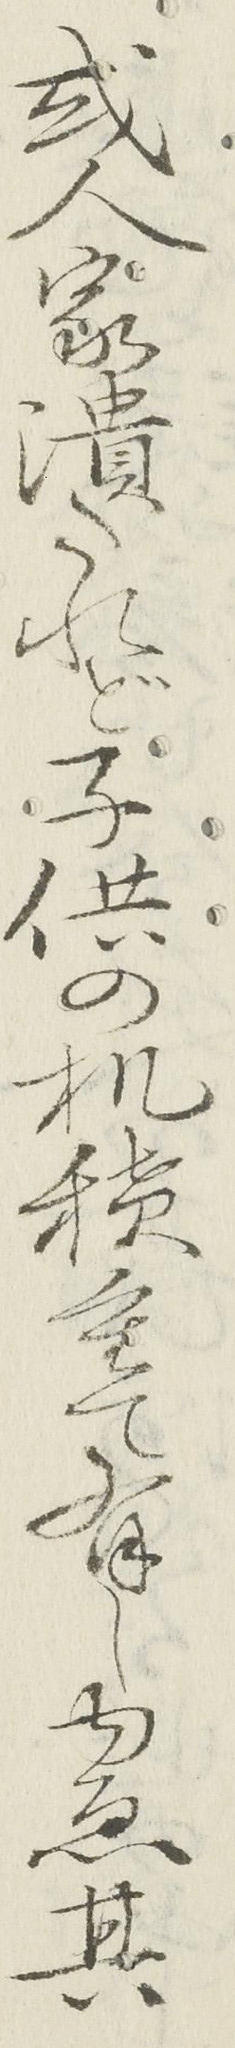或人家潰たれど子供の机積重て有しゆえ其
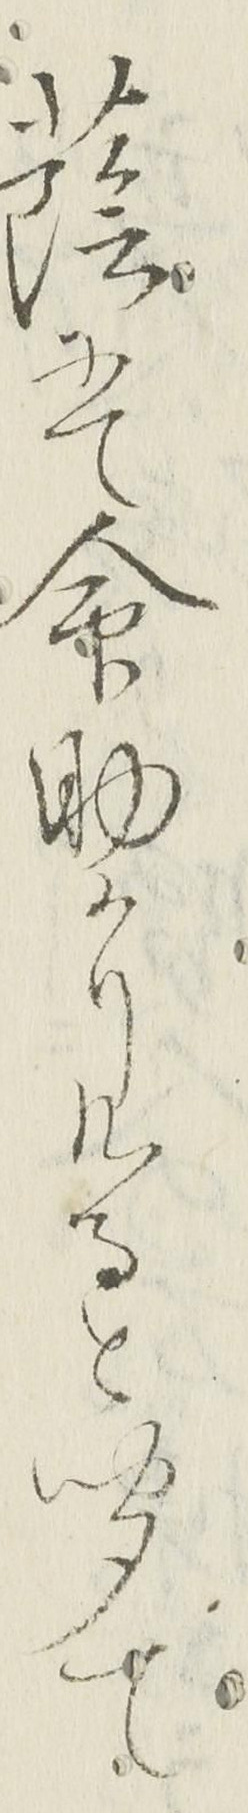蔭にて命助かりけると聞て
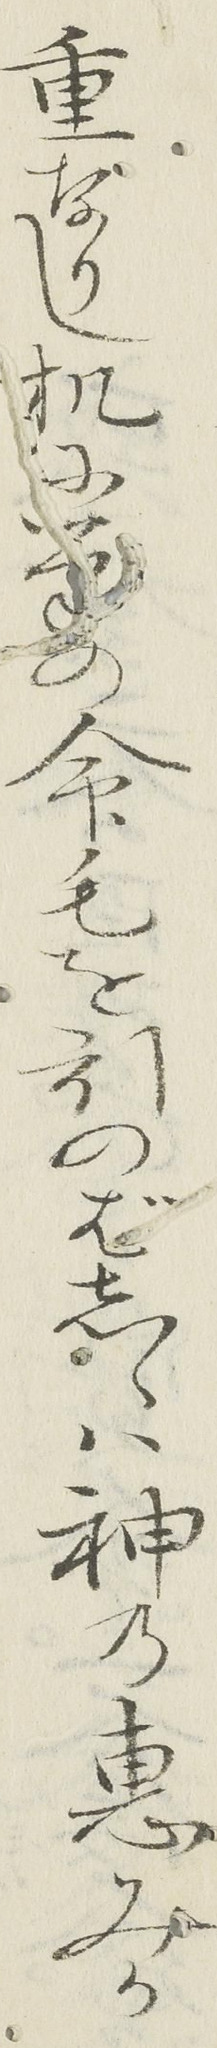重なりし机に筆の命の命毛を引のばしゝハ神の恵か

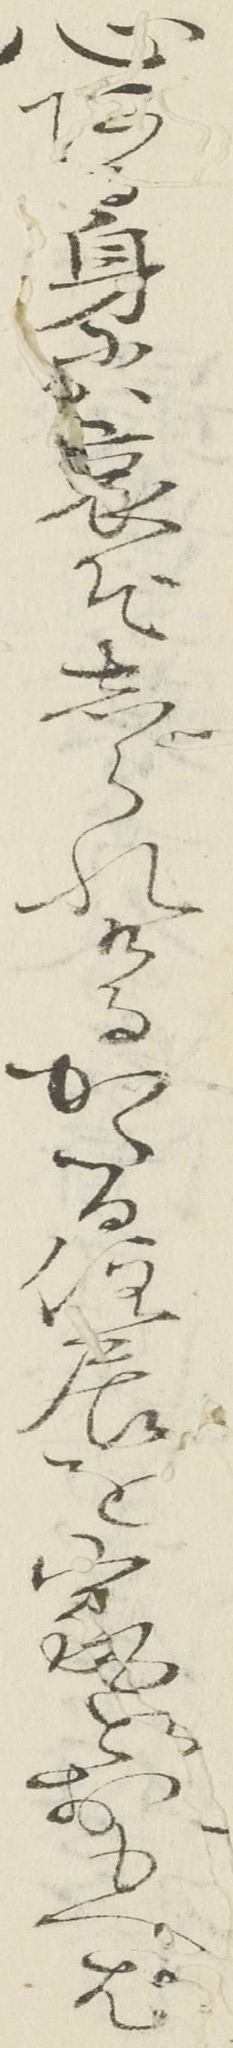心ある身にハ哀ぞしられけるかたる住居を家とおもへば
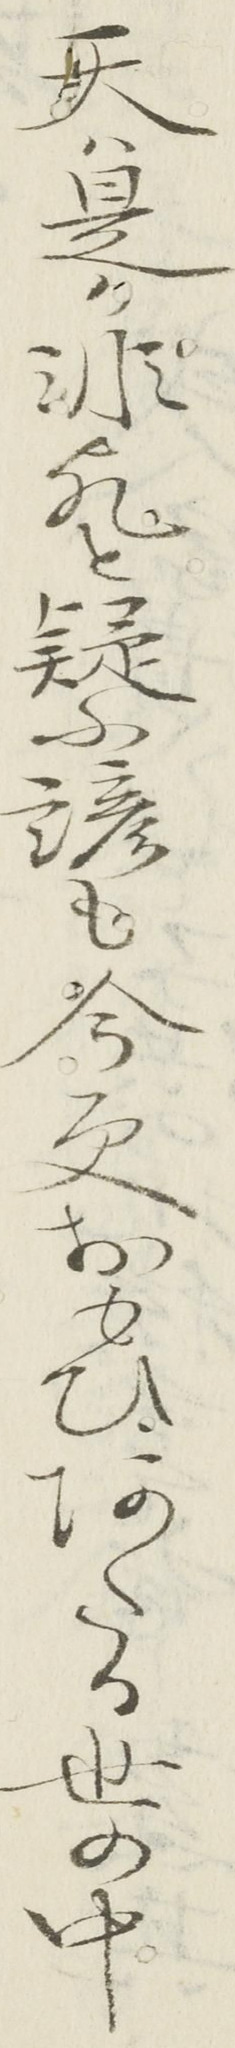天ハ是か非歟と疑ふ諺も今更おもひあたる世の中
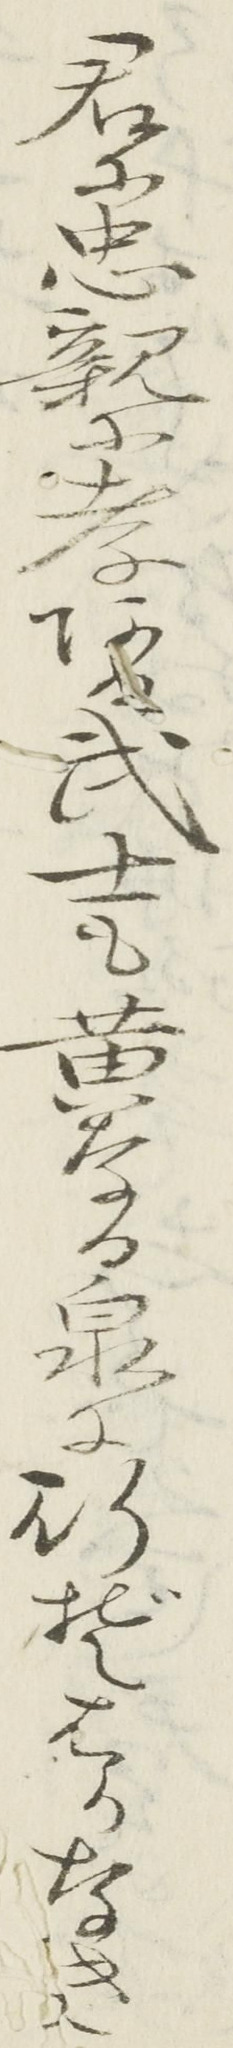君に忠親に孝ある武士も黄なる泉に行ぞはかなき
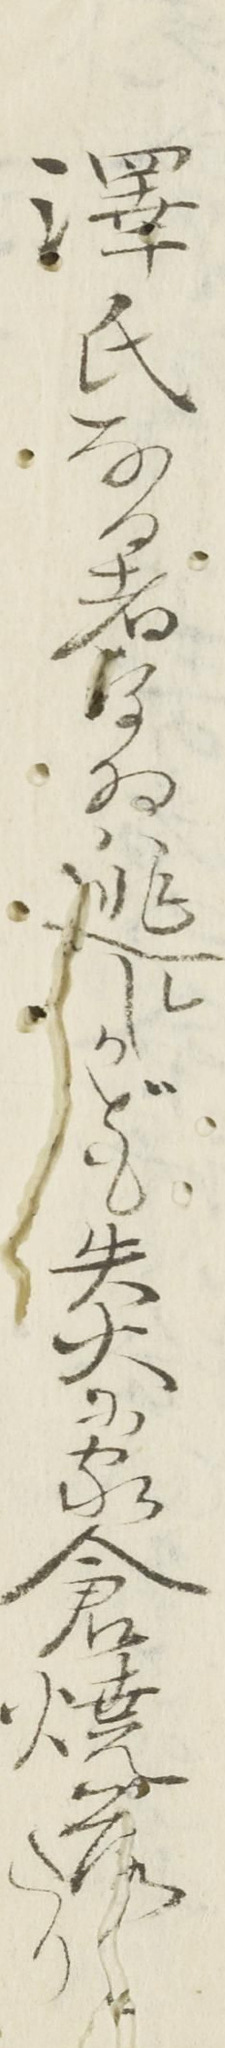沢氏なる者なゐハ逃れしかども失火に家倉焼落
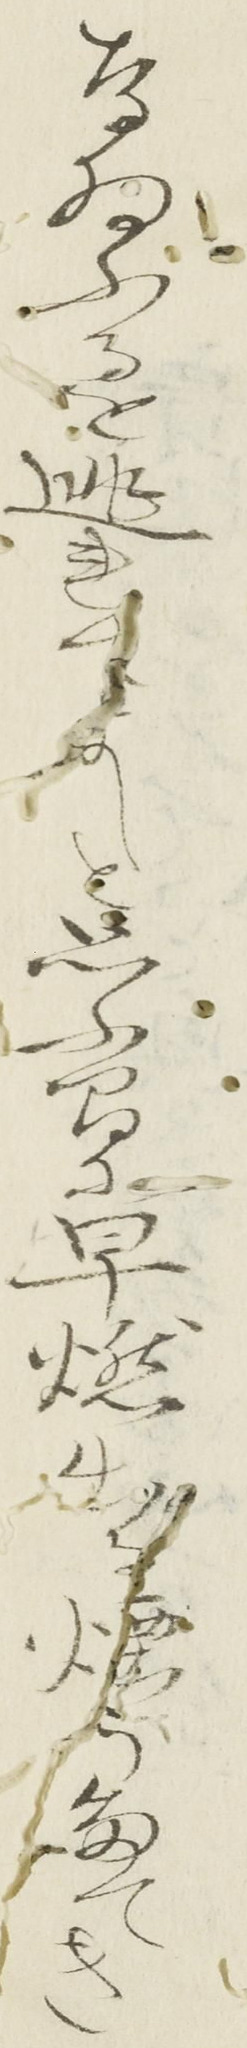なゐふるを逃れしと思ふ間に早燃出る煙うたてき
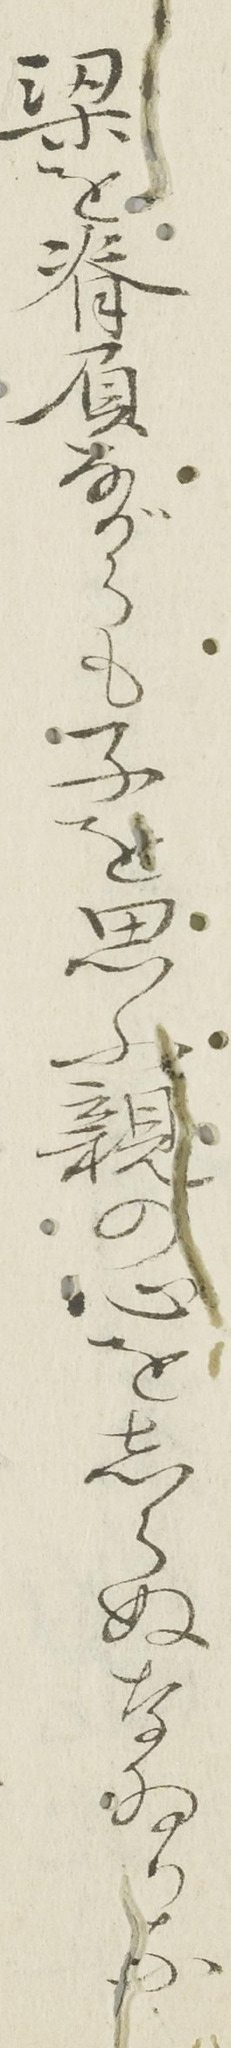梁を背負ながらも子を思ふ親の心をしらぬなゐかな
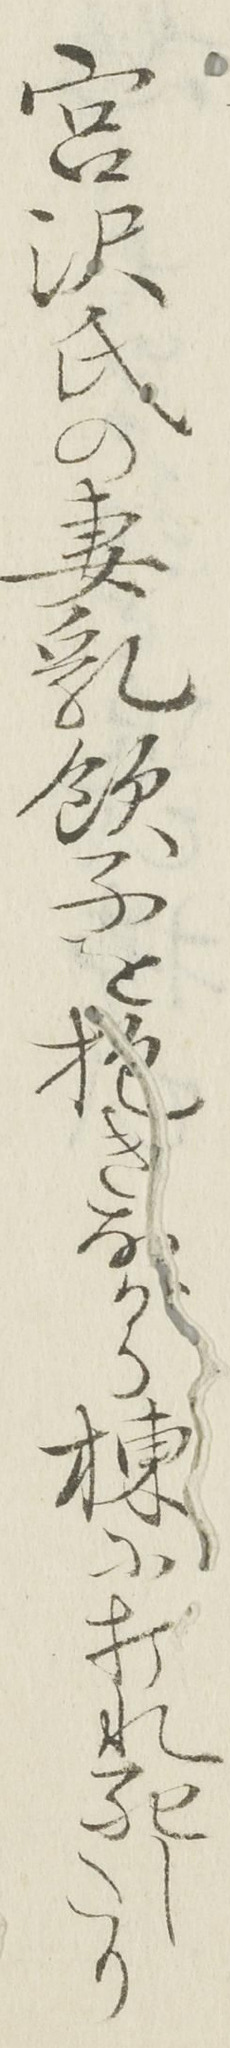宮沢氏の妻乳飲子を抱きながら棟に打れ死したり
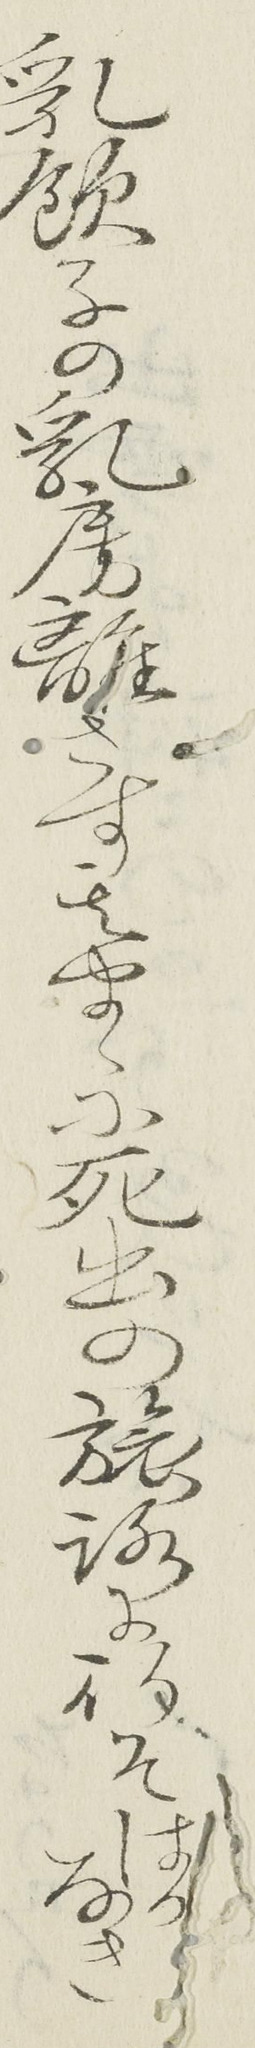乳飲子の乳房離さす其まゝに死出の旅路に行そはかなき
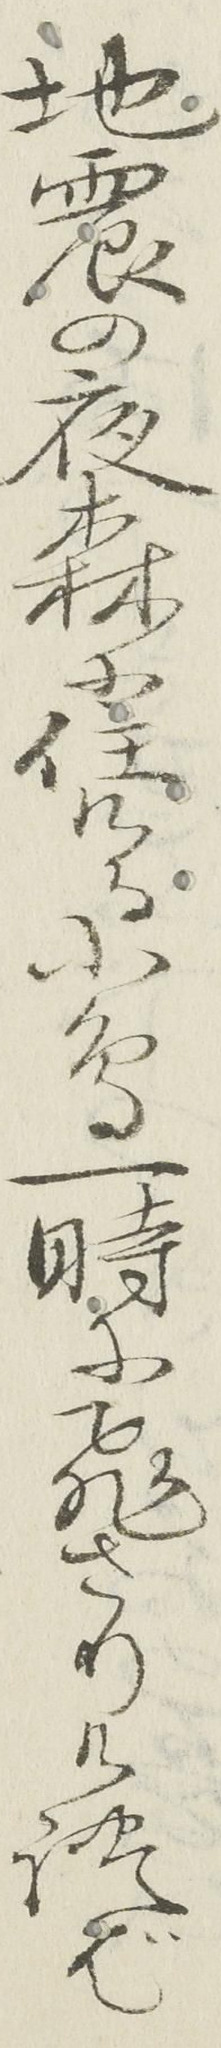地震の夜森に凭る小鳥一時に飛さりければ
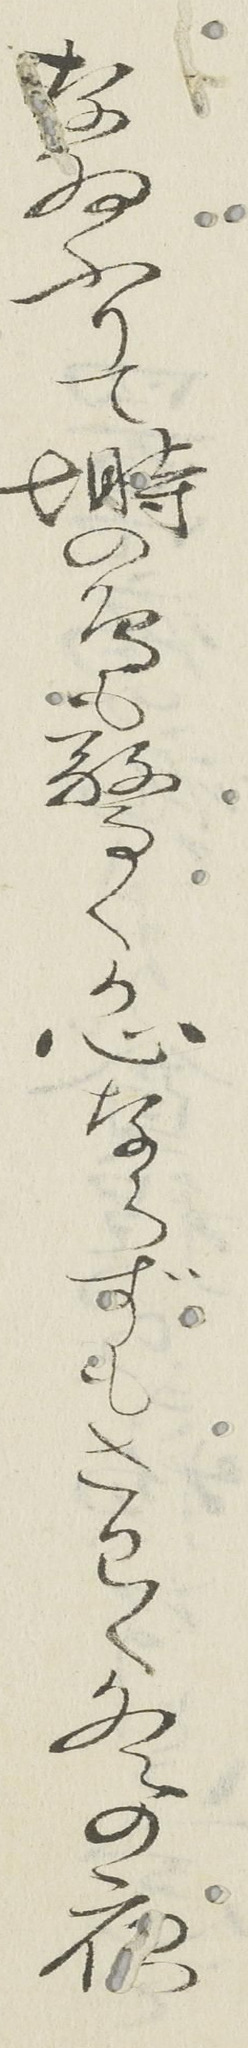なゐふりて塒の鳥も歌なくか心ならずもさわく冬の夜
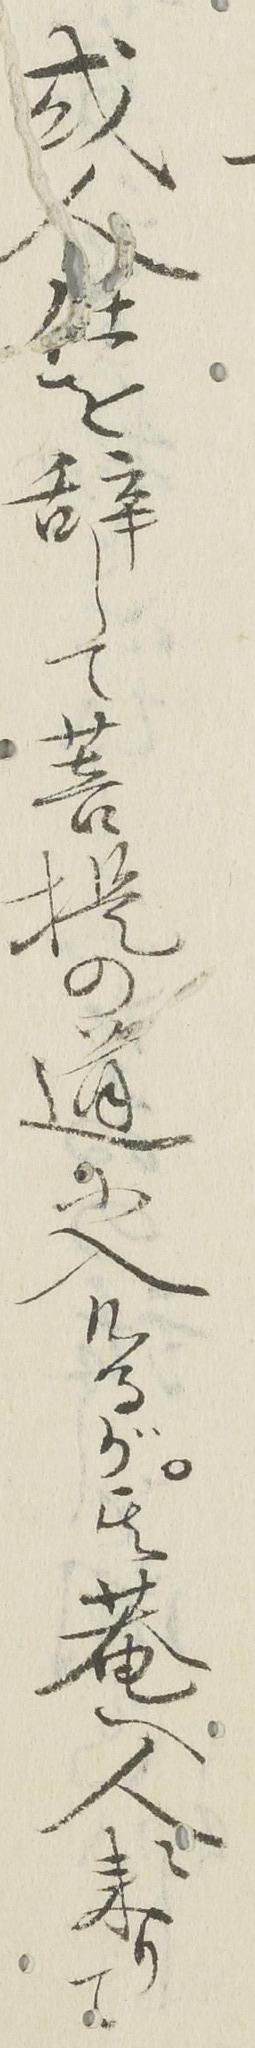或人仕を辞して菩提の道に入けるが其庵へ人々来り候
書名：地震考證　全
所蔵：東京大学地震研究所図書室 Earthquake Research Institute Library, The University of Tokyo, JAPAN
